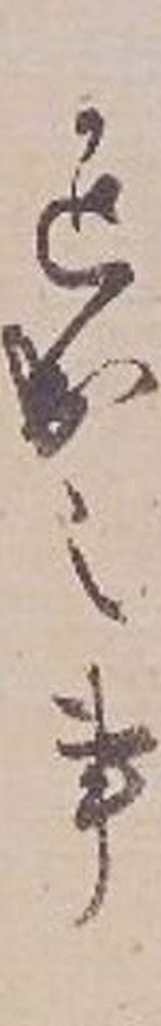退出之事
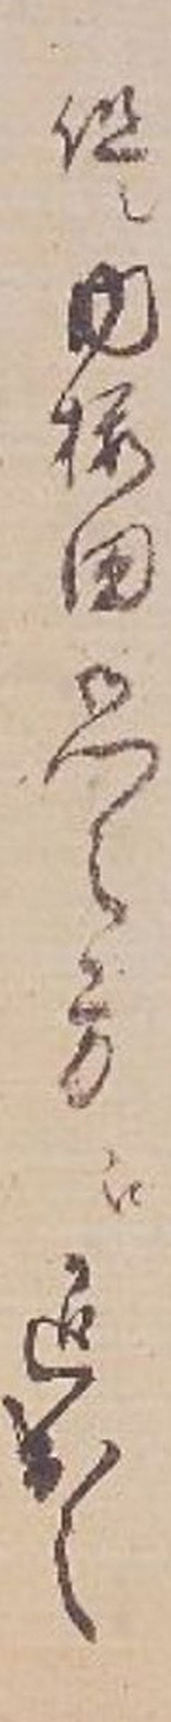但し内桜田御門之方え退出之
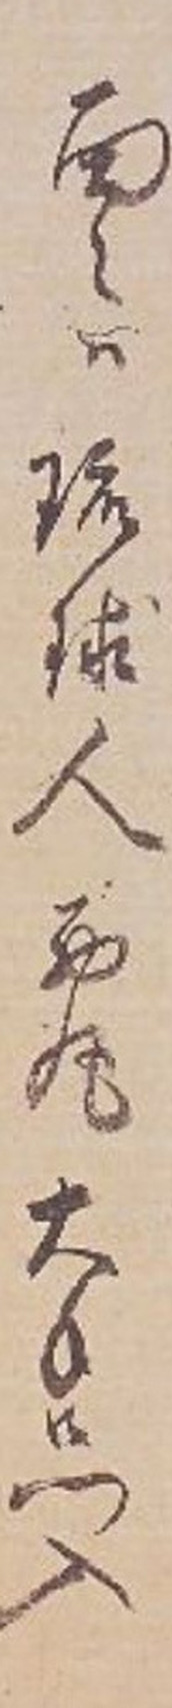面々ハ琉球人西丸大手御門入
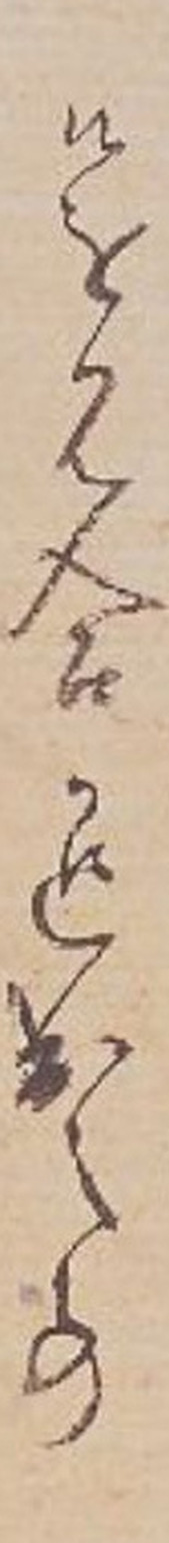口を見合退出之事
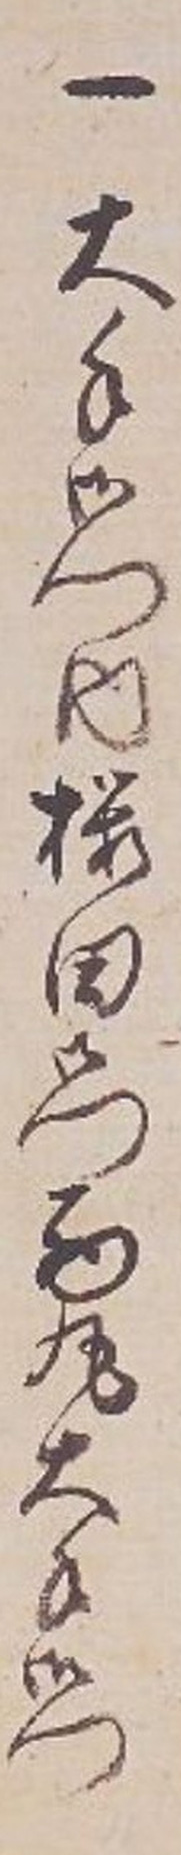一大手御門内桜田御門西丸大手御門
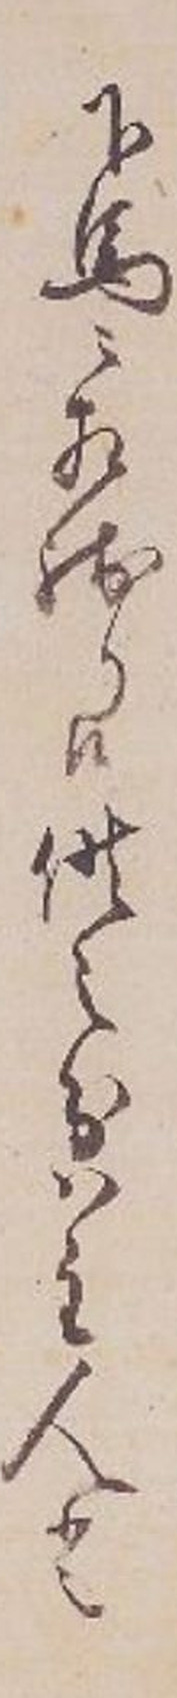下馬に相残り候供之分ハ主人登
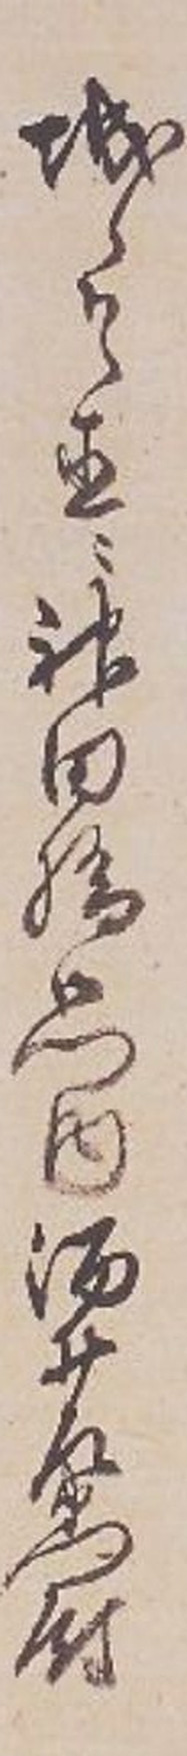城候ハゝ直ニ神田橋御門内酒井左衛門尉
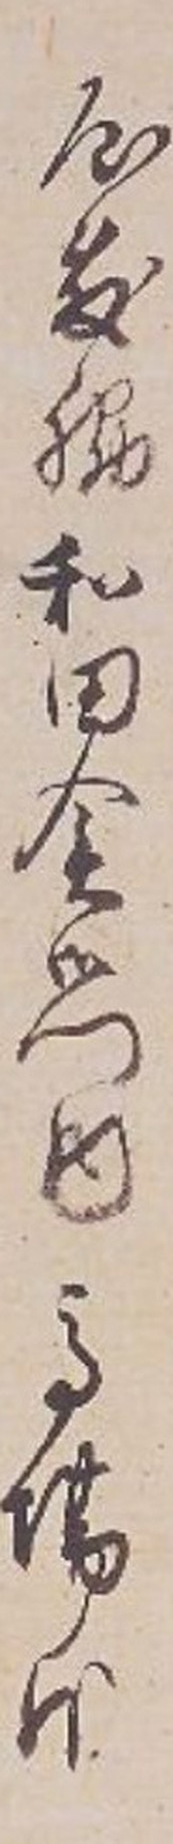屋敷脇和田金右衛門内馬場ノ外
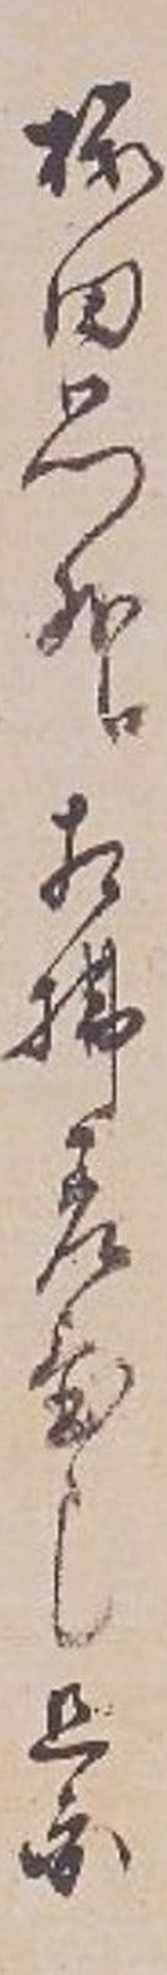桜田御門外江相払差出候且亦
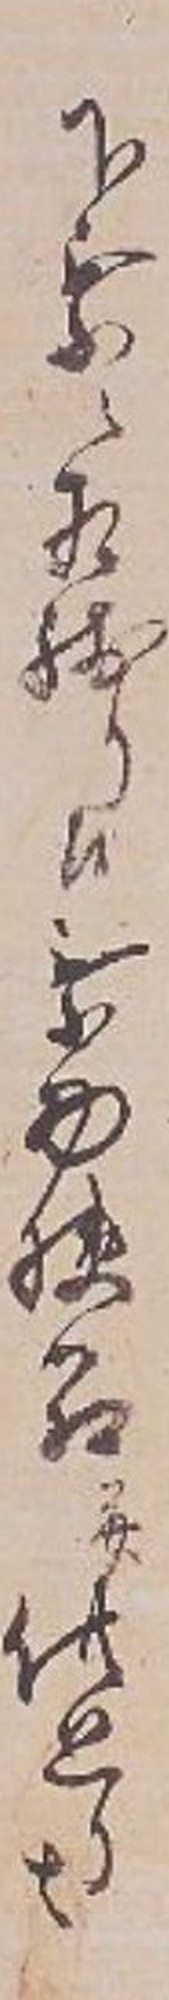下乗ニ相残り候乗物挟箱幷供廻り者

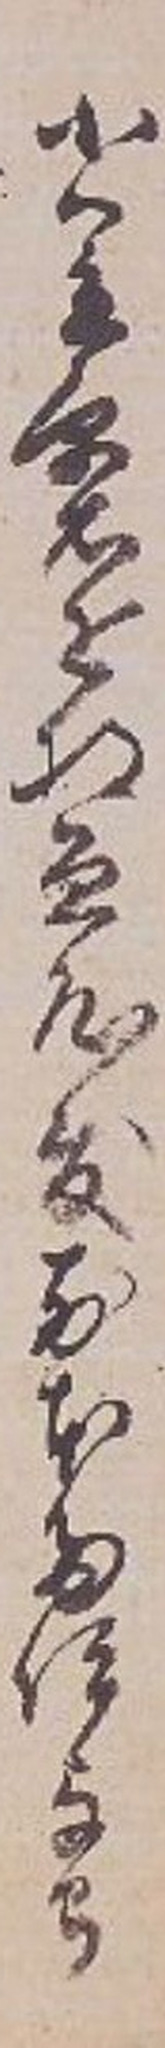小笠原右近将監屋敷前本多伊予守
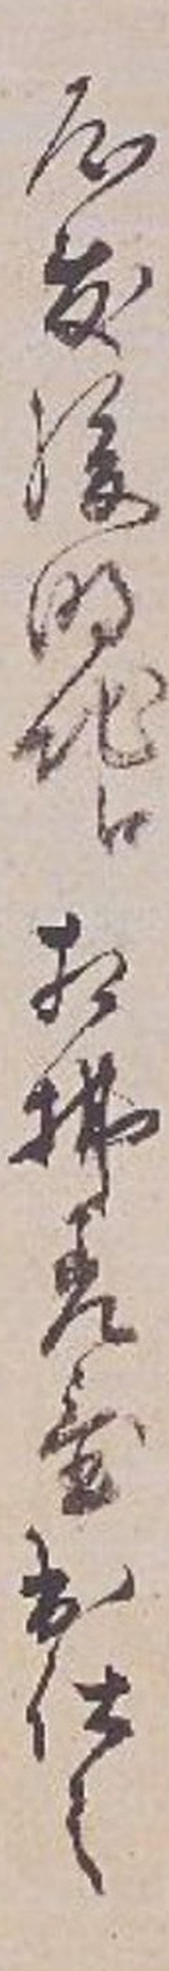屋敷後明地え相払差置出仕之
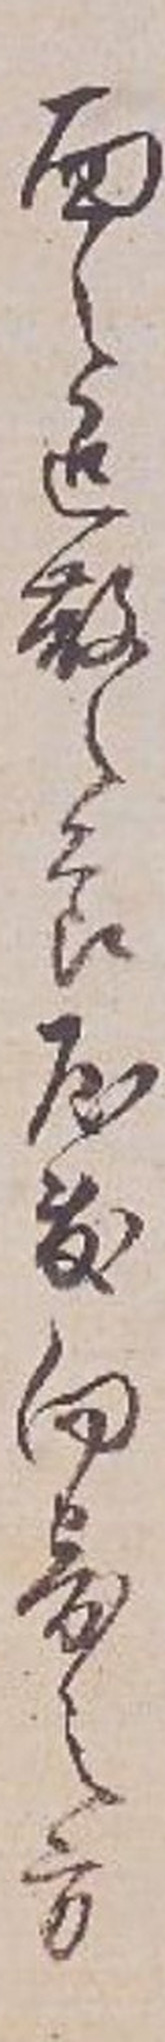面々退散之節屋敷向寄之方
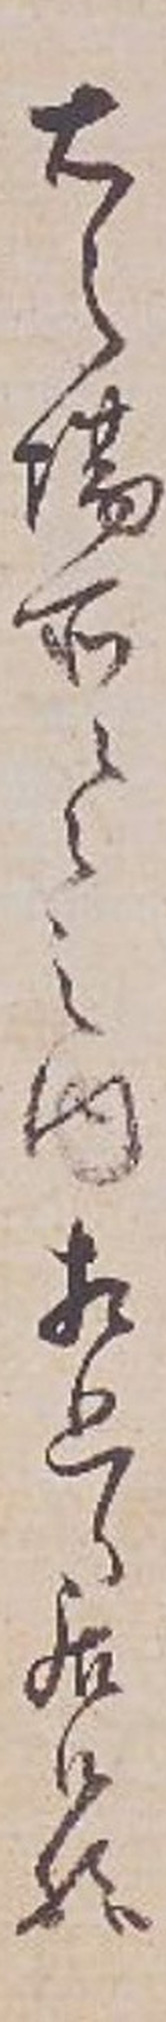右之場所々々之内相廻り居候様
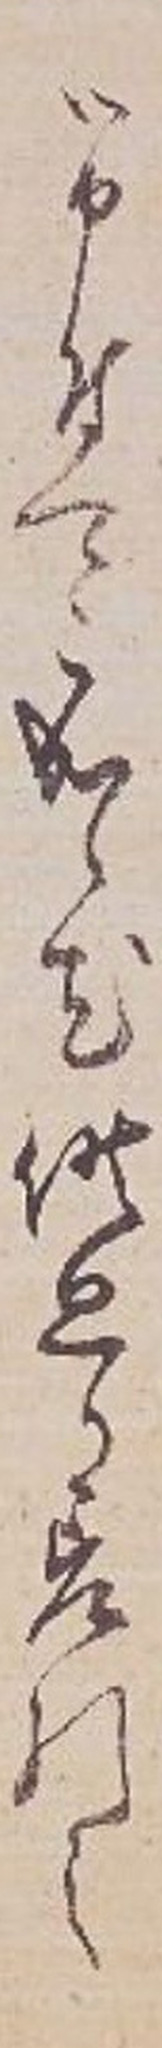御申付可被成候尤供廻り差引之
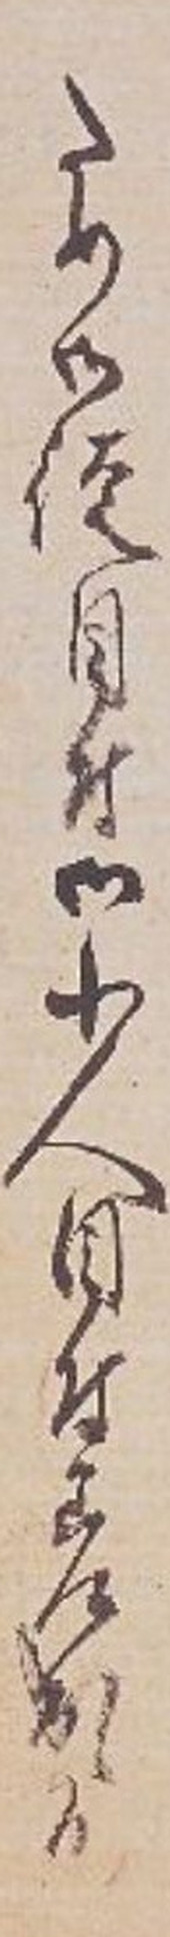ため御徒目付御小人目付差出し候
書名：琉球人来朝記 一、二
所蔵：University of the Ryukyus Library
